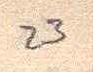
23
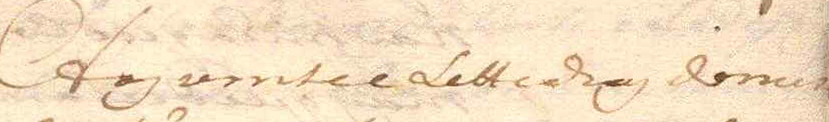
Aos vinte e sette dias do mes
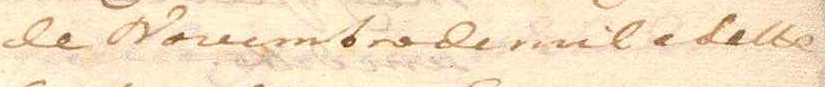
de Novembro de mil e sette
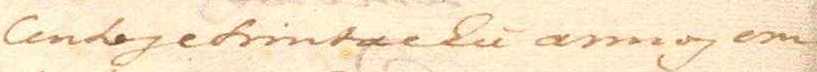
centos e trinta e hū annos em
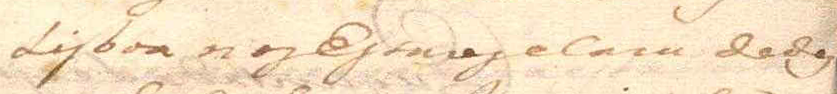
Lisboa nos Estaos e caza de des
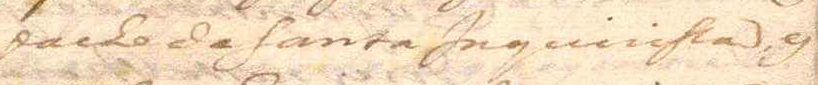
pacho da santa Jnquizissaõ, es
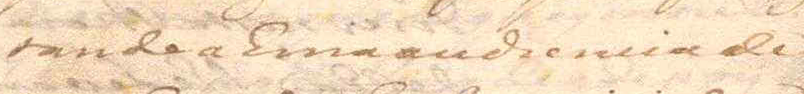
tando ahi na audiencia de
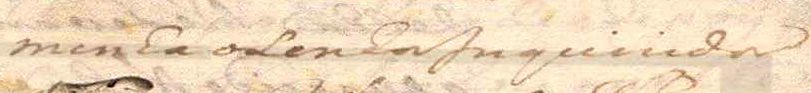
menha o senhor Jnquizidor
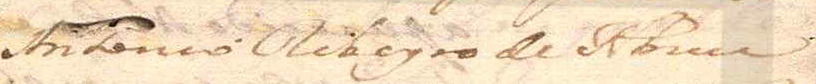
Antonio Ribeyro de Abreu
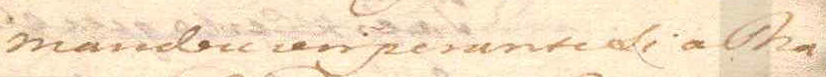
mandou uir perante si a Ma
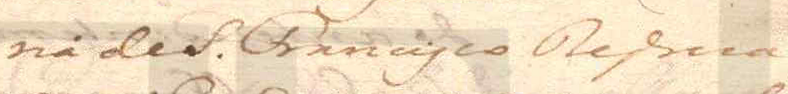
ria de S. Francisco Re preza
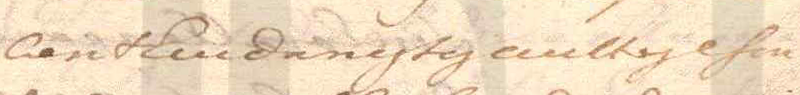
contheuda nestes auttos e sen
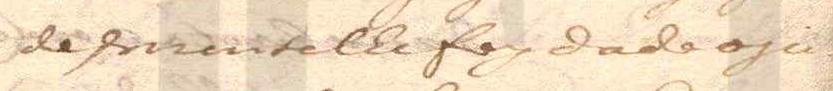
do prezente lhe foy dado o ju
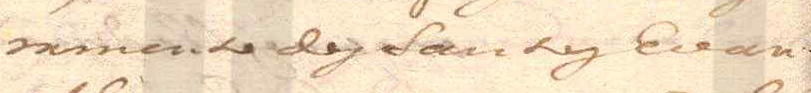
ramento dos Santos Euan
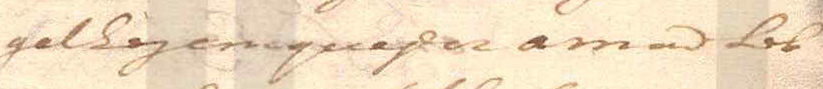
gelhos em que poz a maõ sob
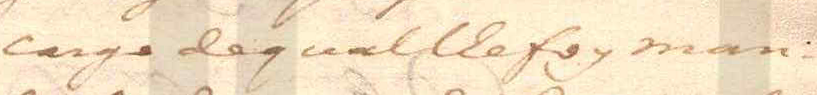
cargo do qual lhe foy man
